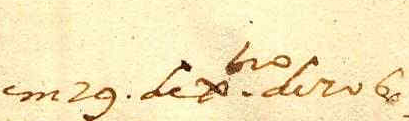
em 29. de x.bro de 706
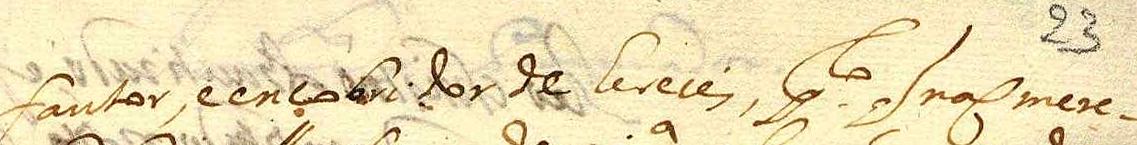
fautor, e encobridor de hereies, pl.o q̄ naõ mere
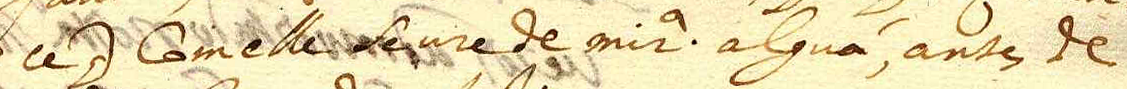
ce q̄ Com elle se uze de miz.a alguā, antes de
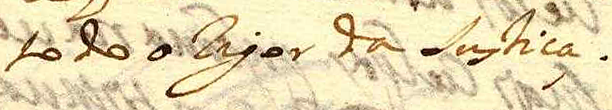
todo o Rigor da Iustiça.
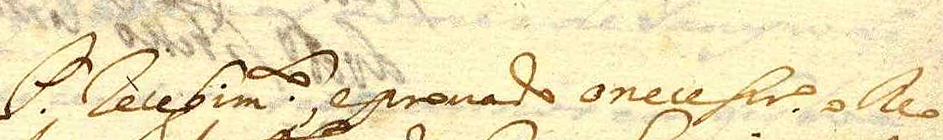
P. Recebim.to; e prouado o necessr.o o Reo
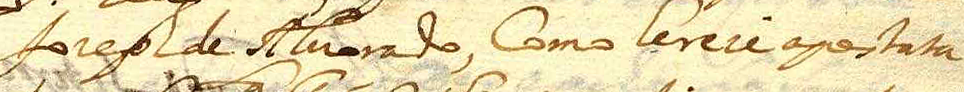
Jozeph de Aluorado, Como hereie apostata
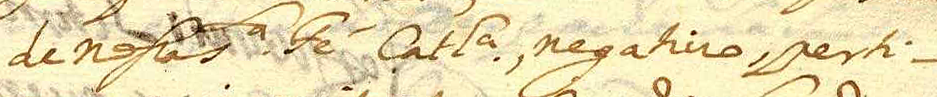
de nossa sta Fé Catha., negatiuo, perti
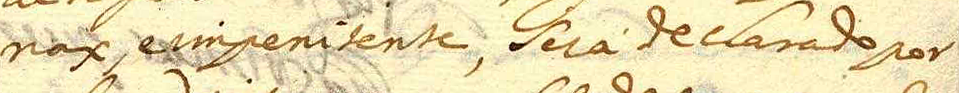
nax, e impenitente, seia declarado por
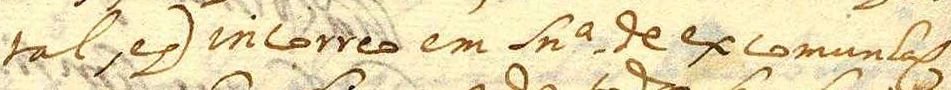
tal, e q̄ incorreo em sna. de excomunhaõ
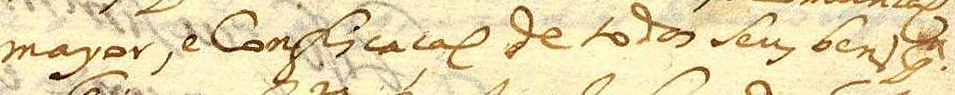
mayor, e Confiscaçaõ de todos seus bens pa.
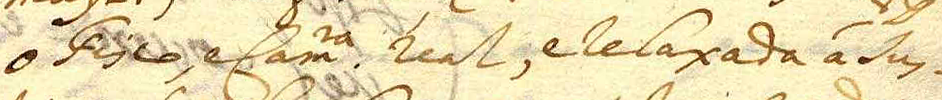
o Fisco, e Camra. Real, e Relaxada á Ius
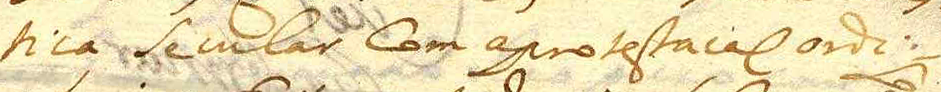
tiça secular Com a protestaçaõ ordi
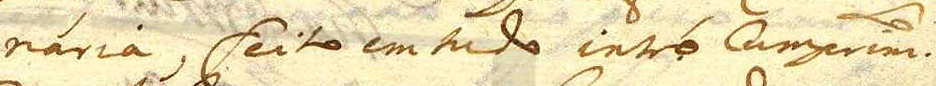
nária, feito em tudo intro. cumprim.to
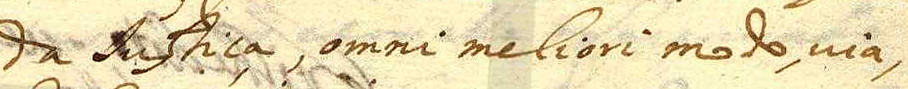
da Iustiça, omni meliori modo, uia,
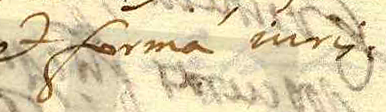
et forma iuris.
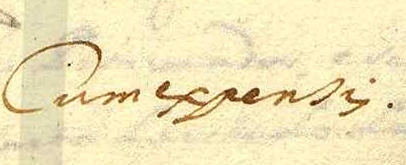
Cum expensis.
